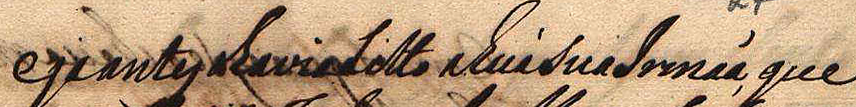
e ja antes o havia ditto a huā sua Irmaã, que
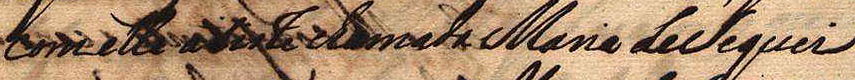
com elle asiste chamada Maria de Sequei
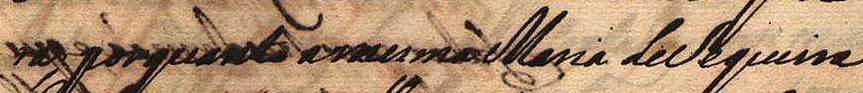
ra, porquanto a mesma Maria de Sequeira
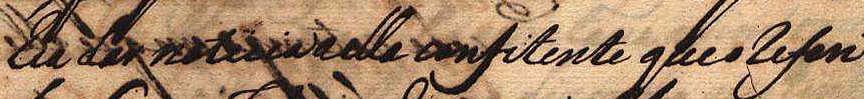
hia dar noticia a ella confitente que o Referi
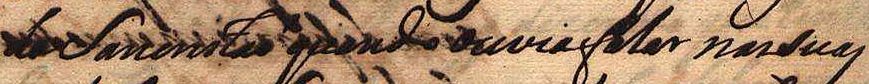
do Sancristaõ quando ouvia falar nas suas
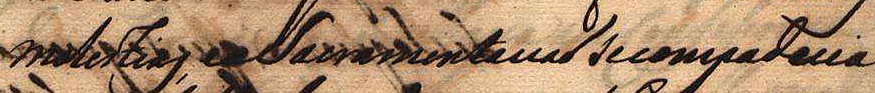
molestias, e o Sacramentauaõ se compadecia
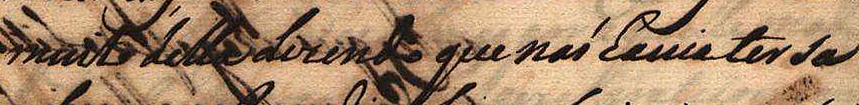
muito della dizendo que naõ hauia ter sa
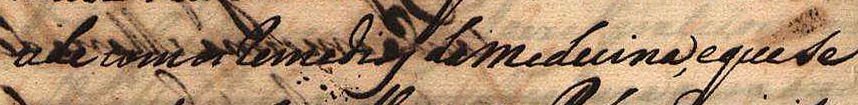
ude com os Remedios da medecina, e que se
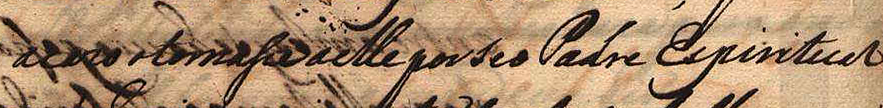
acazo o tomasse a elle por seo Padre Espiritual
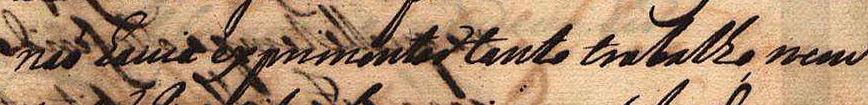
naõ hauia exprimentar tanto trabalho, nem
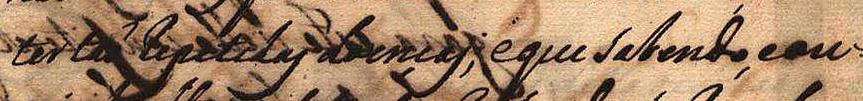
ter taõ Repetidas doenças, e que sabendo, e ou
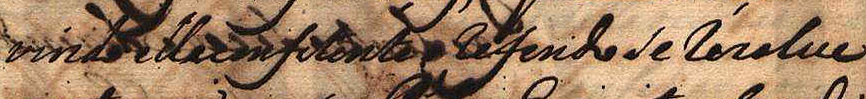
vindo ella confitente o Referido se Rezolue
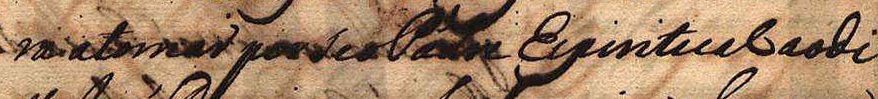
ra a tomar por seo Padre Espiritual ao di
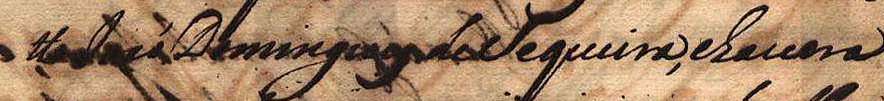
tto Ioaõ Domingues de Sequeira, e hauera
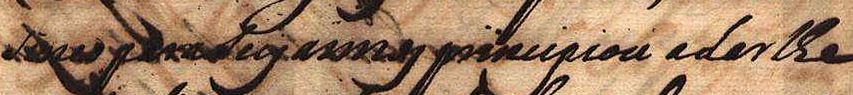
sinco para seis annos principiou a darlhe
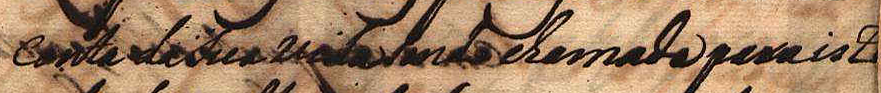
conta da sua vida sendo chamada para ist
